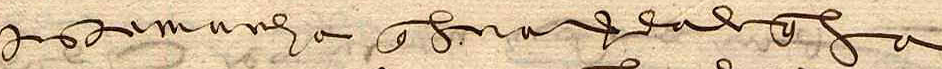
testemunha q̄ hera ꝟdade q̄ ha
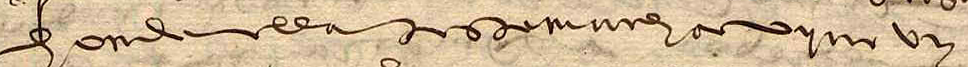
honde ella testemunha vyue vy
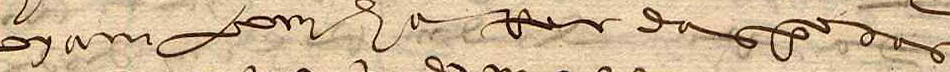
vyam com ha Ree das p̄otas
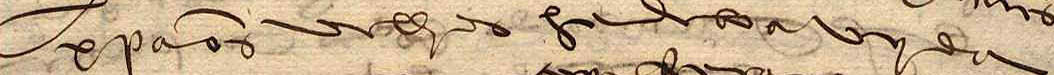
xpaõs velhos he de boa vyda
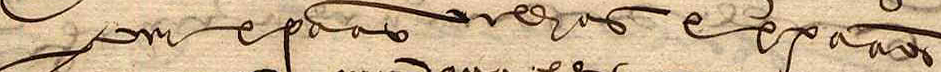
com xpāas velhas e xpaãos
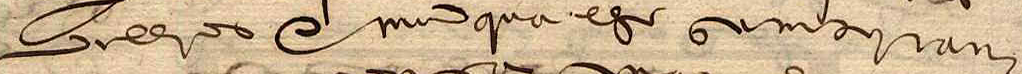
velhos e mūqua lhe semtyram
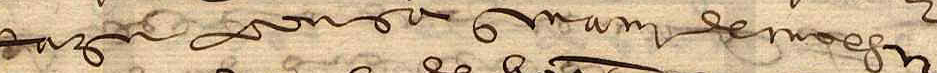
ffazer cousa senam de molher
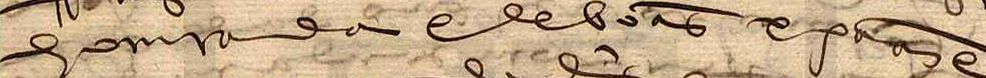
homrada e de boās xpāa e
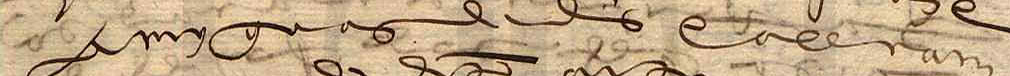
amyguas de ds̄ e all nam
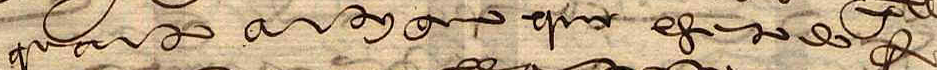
quarto artyguo que lhe todo foy
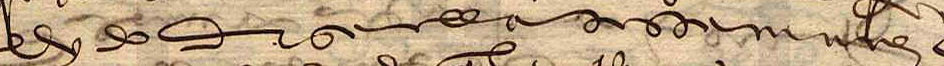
llydo dise ella testemunha
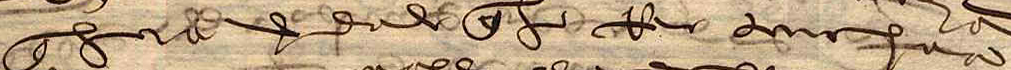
q̄ hera ꝟdade q̄ ho Ree teue huā
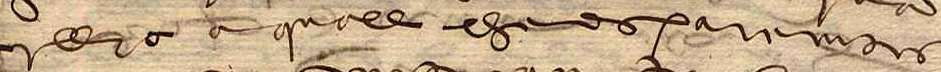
fjlha a quall lhe os paremtes
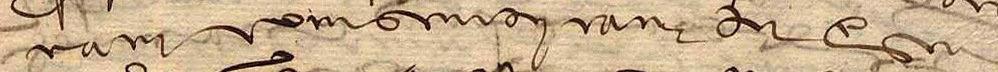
nam comsemtyram ter ē seu
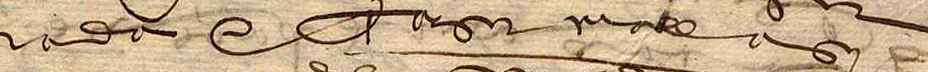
herada e fazer mall asy
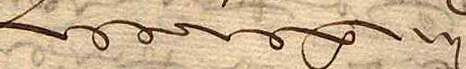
esto esp̄uy
